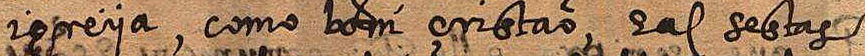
igreya, como bom cristaõ, E as sestas
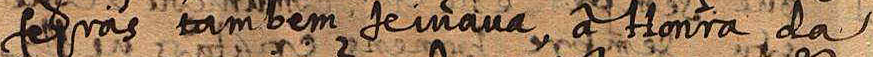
fejras tambem Jeiūaua, â Honra da
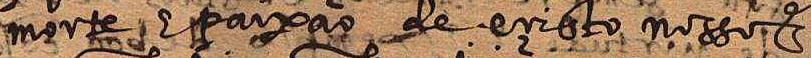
morte E paixão de cristo nosso sor
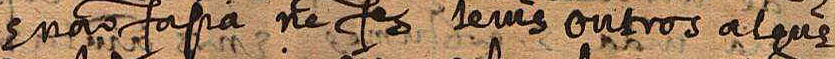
E naõ fasia nē fes ieiūs outros algūs
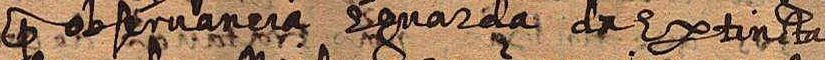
ꝑ obseruancia E guarda da Extincta
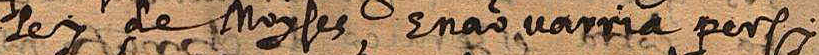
ley de Moyses, E naõ uarria per sy
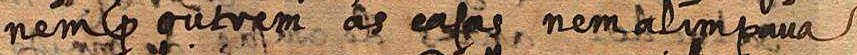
nem ꝑ outrem as casas nem alimpaua
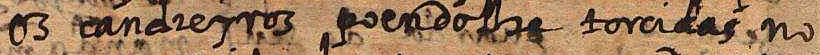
os candieyros poendolhe torcidas no
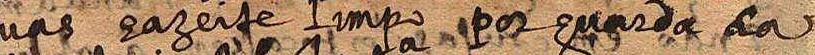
uas E azeite limpo por guarda da
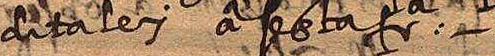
dita ley â sesta fra.
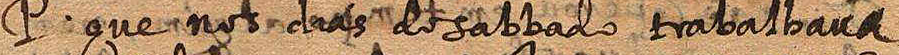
P. que nos dias do sabbado trabalhaua
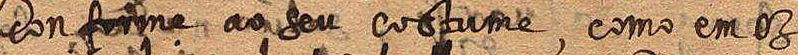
conforme ao seu costume, como em oz
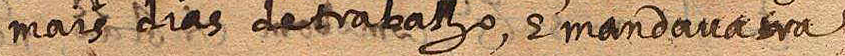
mais dias de trabalho, e mandaua tra
